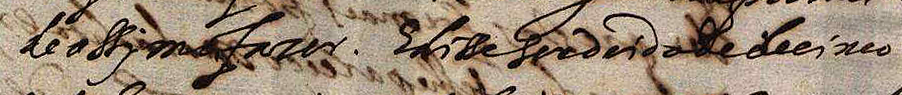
de assym o fazer. E disse ser de idade de cinco
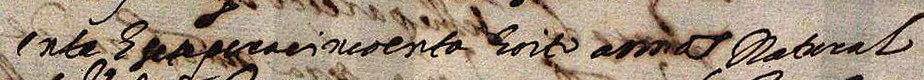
enta E sete pera cincoenta E oito annos natural
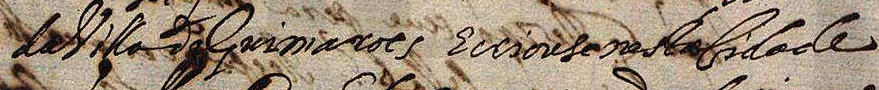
da Villa de Guimaroes E criouse nesta Cidade
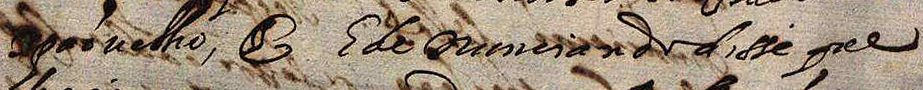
xpaõ uelho, ⁋ E denunciando disse que
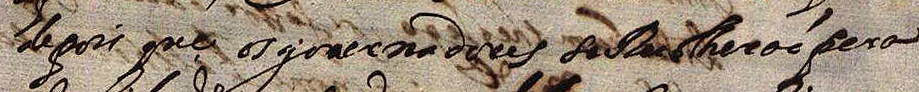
depois que os gouernadores se Recolheraõ pera
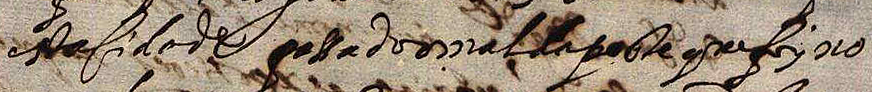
esta Cidade passado o mal da peste que foy no
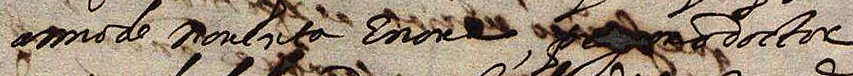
anno de nouenta E noue, pregou o doctor
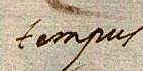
tempus
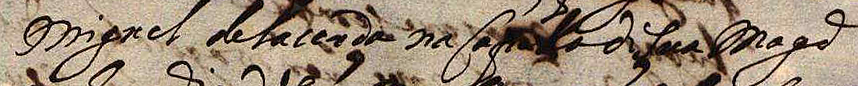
Miguel de Lacerda na Capela de Sua Magde
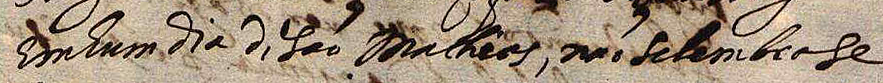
Em hum dia de São Mathias, não se lembra se
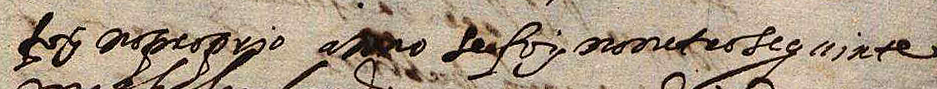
foy no proprio anno se foy no outro seguinte
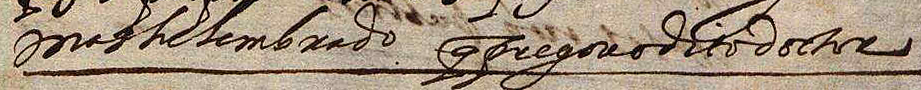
mas he lembrado q̄ pregou o dito doctor
